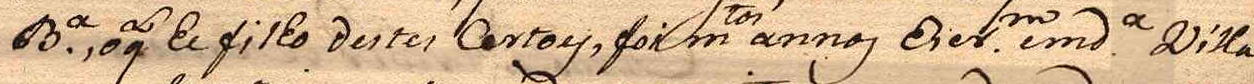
B.a, o q.to he filho destes Certoes, foi m.tos annos hier.m em d.a Villa
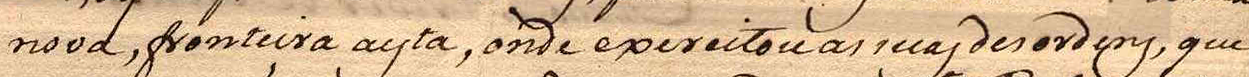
nova, fronteira a esta, onde exercitou as suas desordens, que
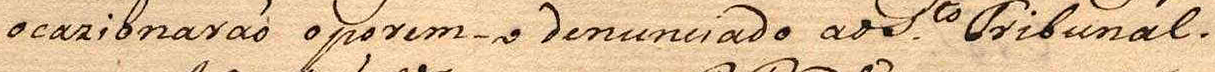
ocazionaraõ o porem-o denunciado ao S.to Tribunal.
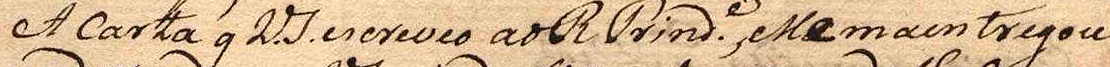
A Carta q̄ V.S. escreveo ao R. Trind.e, elle ma entregou
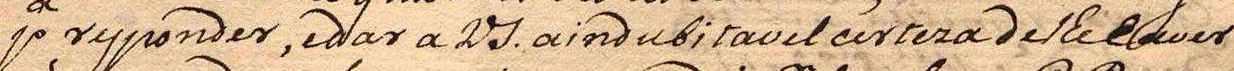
p.a responder, e dar a V.S. a indubitavel certeza de lhe haver
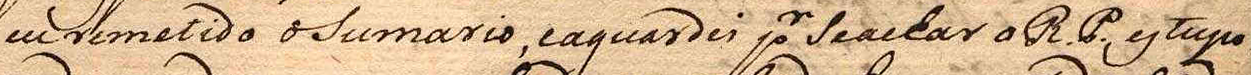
eu remetido o Sumario, e a guardei p.r se achar o R. P. estupo
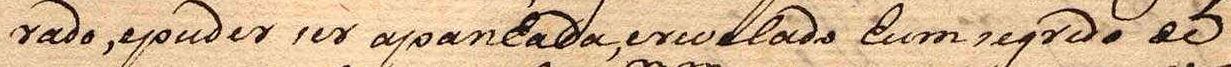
rado, e puder ser apanhada, e revelado hum segredo de
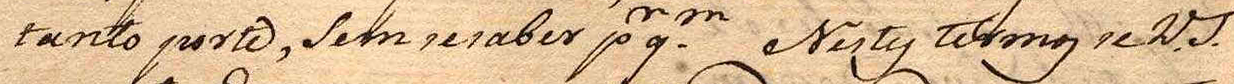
tanto porte, Sem se saber p.r q.m Nestes termos se V.S.
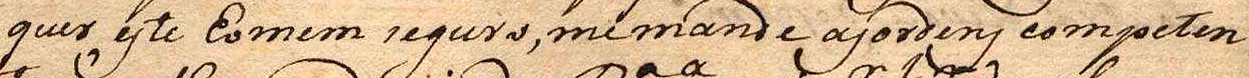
quer este homem seguro, me mande as ordens competen
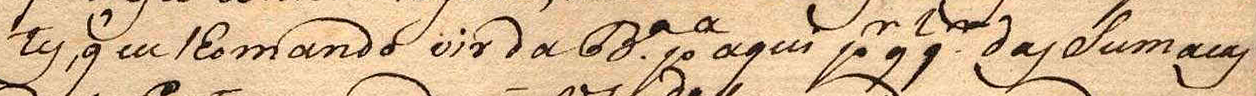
tes, q̄ eu lho mando vir da B.a p.a aqui p.r q.l q.r das Sumaeas
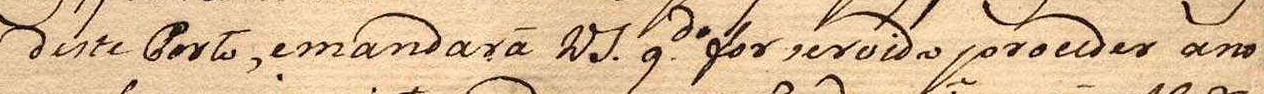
deste Porto, e mandará VS. q.do for servido proceder a no
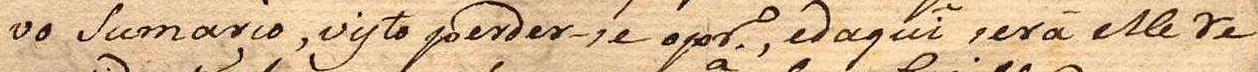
vo Sumario, visto perder-se o pr.o, e daqui será elle re
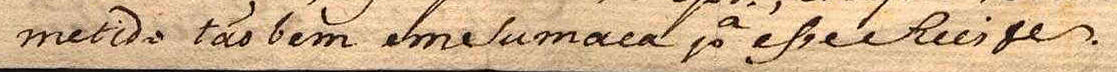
metido taõbem em Sumaea p.a esse Recife
